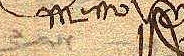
memorya
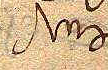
Anto
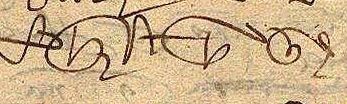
Rojz p̄vy
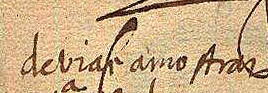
deviase amostrar
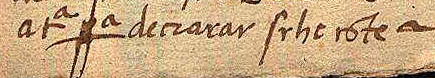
a ta ꝑa decrarar se he este a
